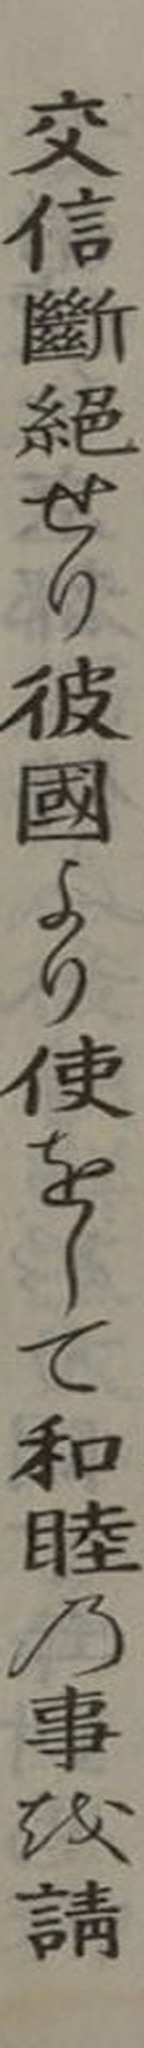交信斷絕せり彼國より使をして和睦の事を請
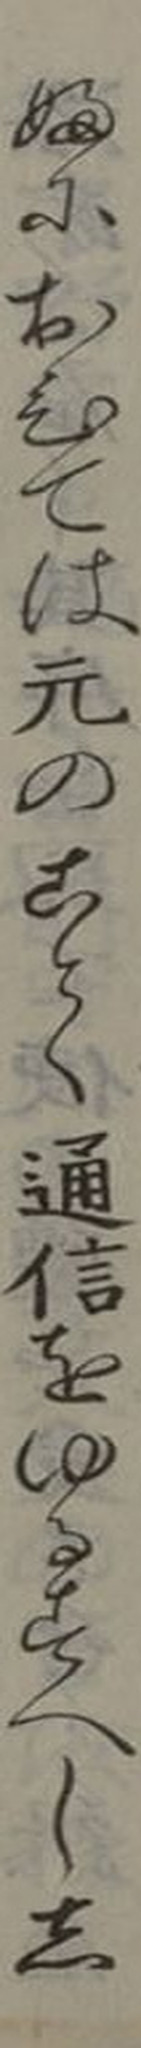ふにおひてハ元のことく通信をゆるすへしし
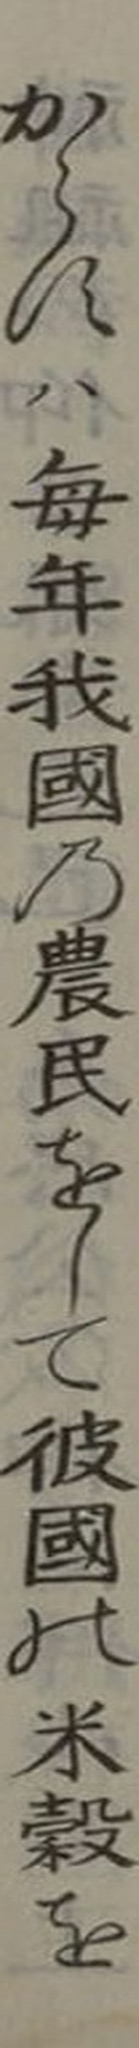からすハ每年我國の農民をして彼國の米穀を
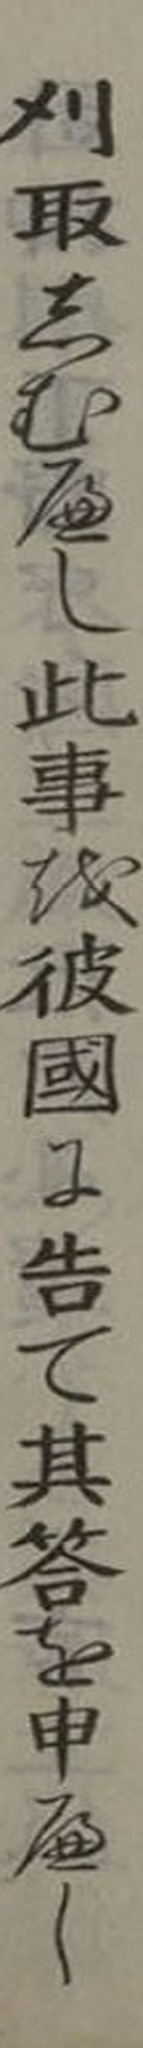刈取しむへし此事を彼國に告て其答を申へし
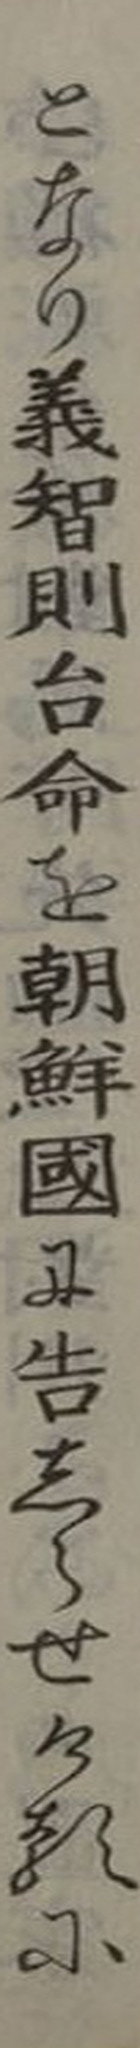となり義智則台命を朝鮮國に告しらせけるに
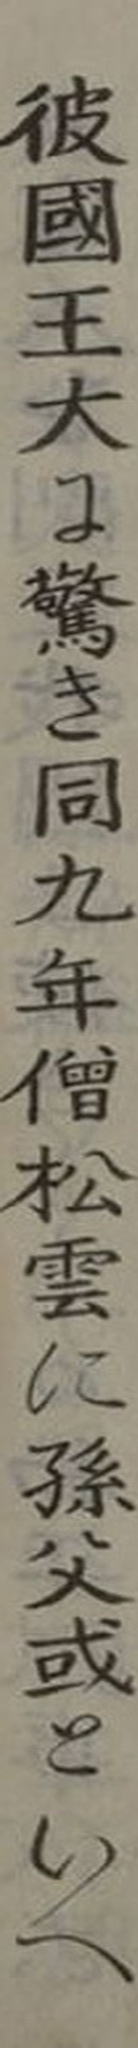彼國王大に驚き同九年僧松雲に孫父或といへ

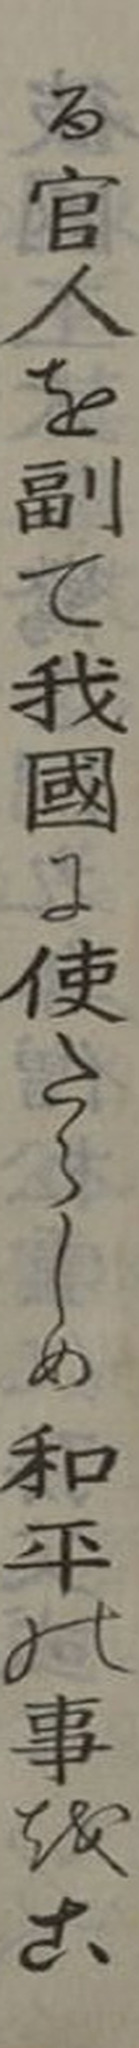る官人と副て我國に使たらしめ和平の事をこ
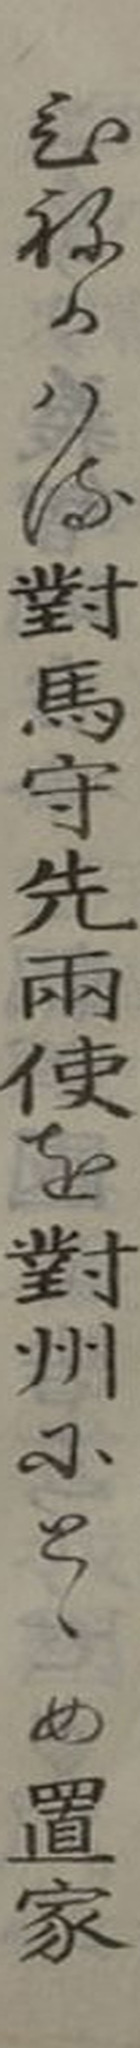ひねかはる對馬守先兩使を對州にとゝめ置家
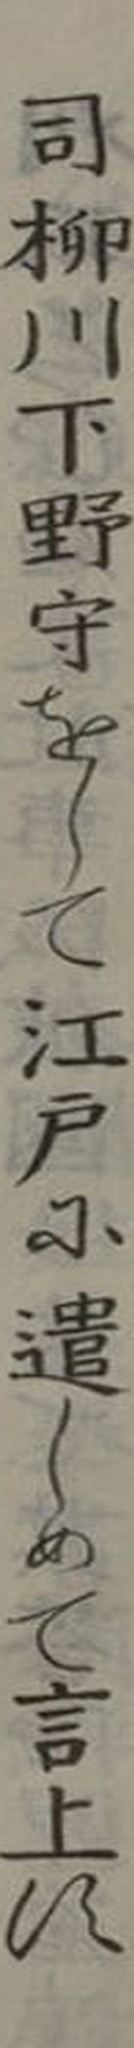司柳川下野守をして江戸に遣しめて言上す
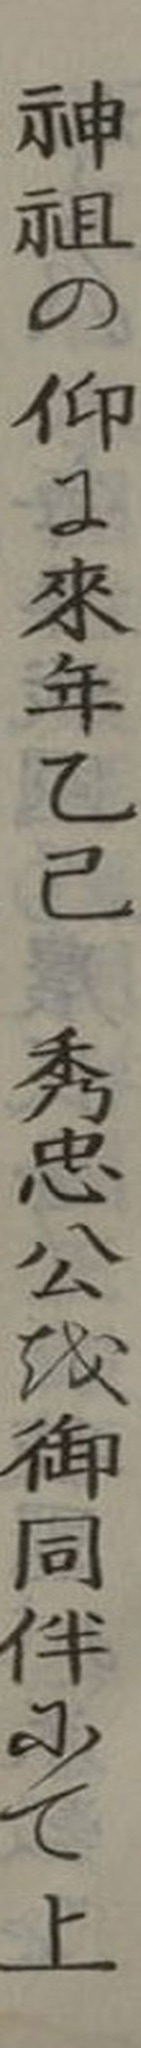神祖の仰に來年乙己秀忠公を御同伴にて上
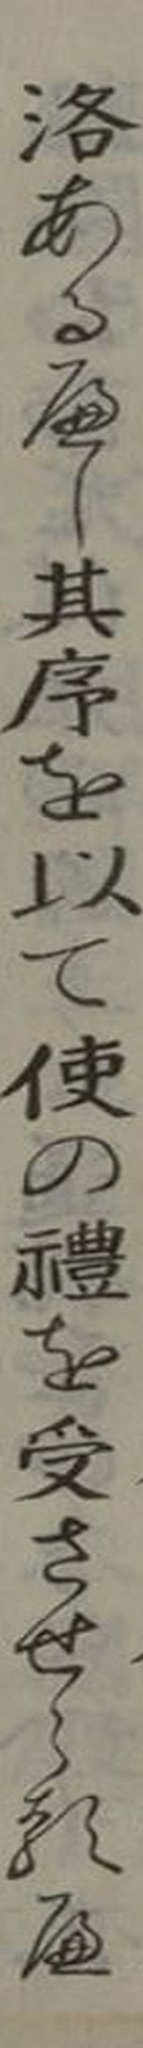洛あるへし其序を以て使の禮を受させらるへ
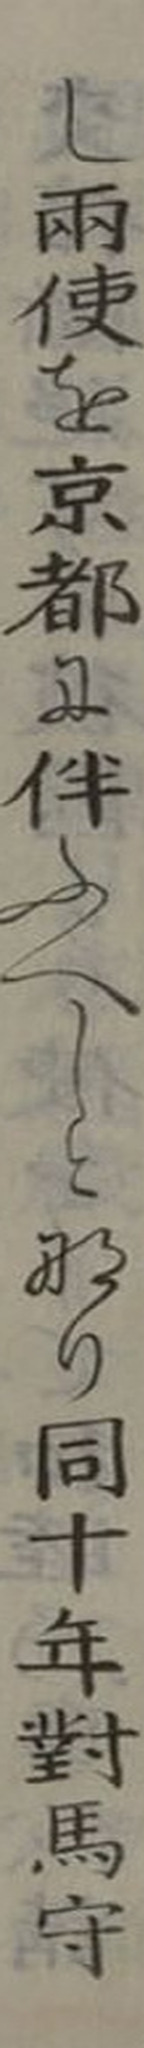し兩使を京都に伴ふへしとなり同十年對馬守
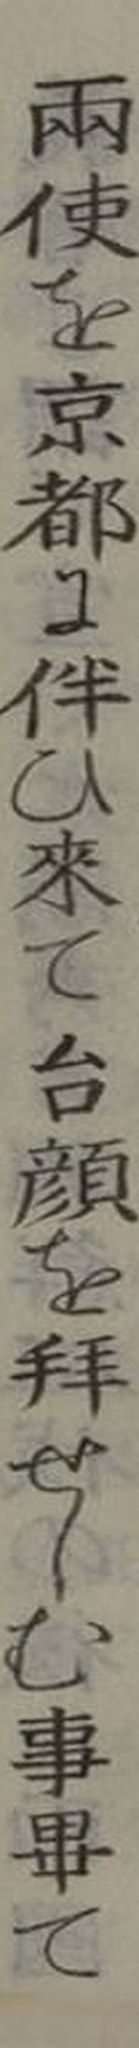兩使を京都に伴ひ來て台顔を拜せしむ事畢て
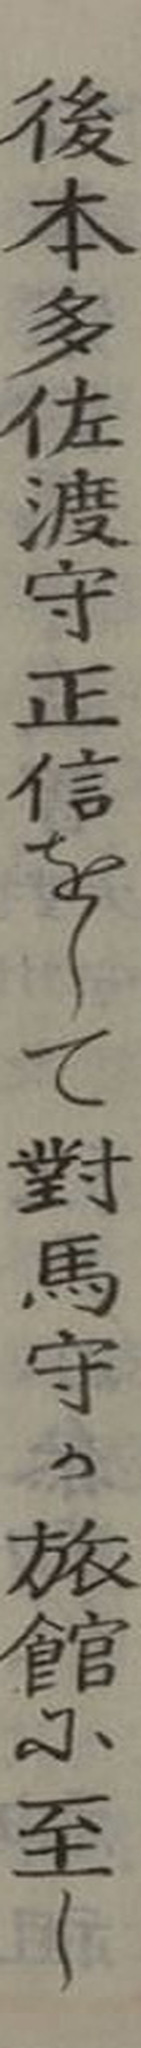後本多佐渡守正信をして對馬守の旅館に至し
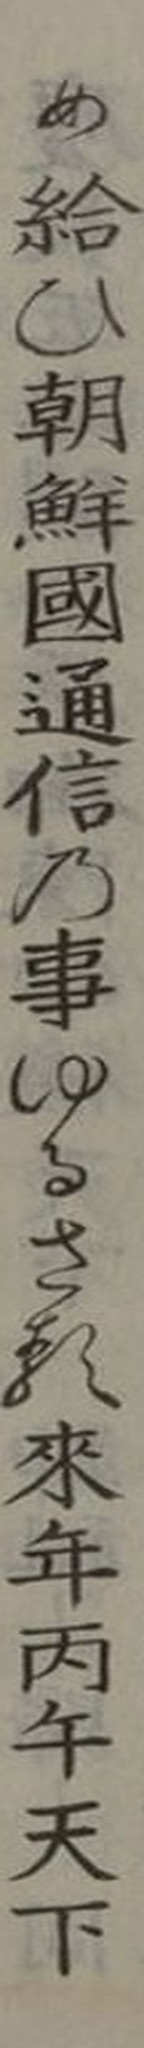め給ひ朝鮮國通信の事ゆるされ來年丙午天下
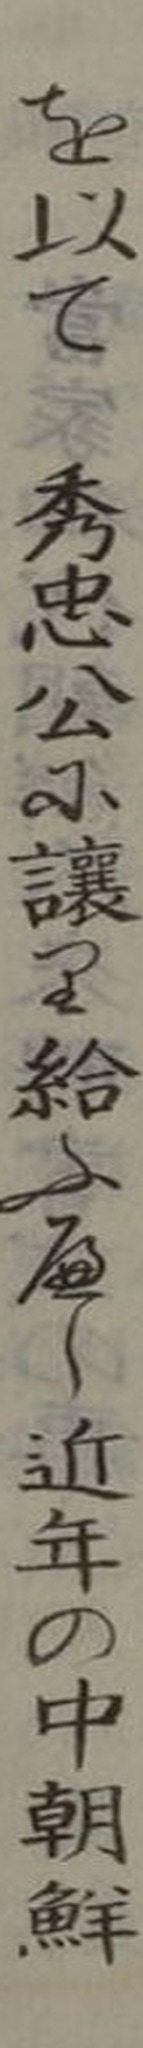を以て秀忠公に讓り給ふへし近年の中朝鮮
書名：骨董録
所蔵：University of the Ryukyus Library
